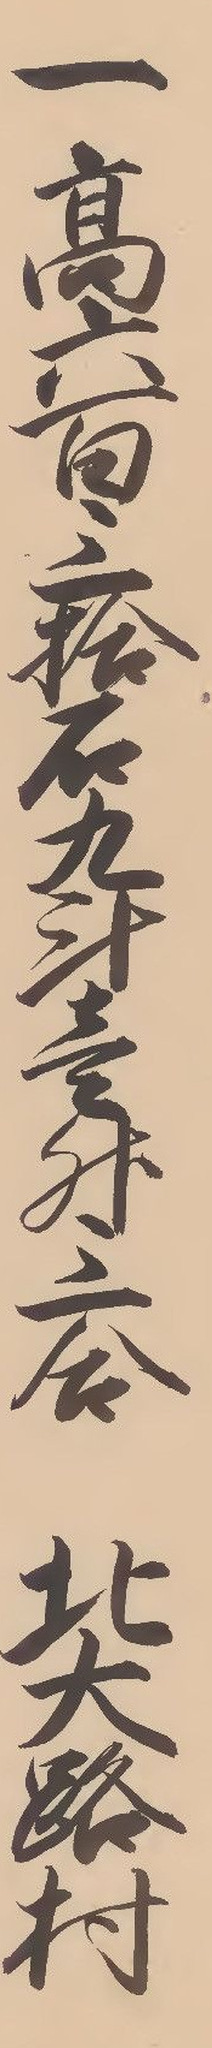一高六百三拾石九斗壱升三合北大路村
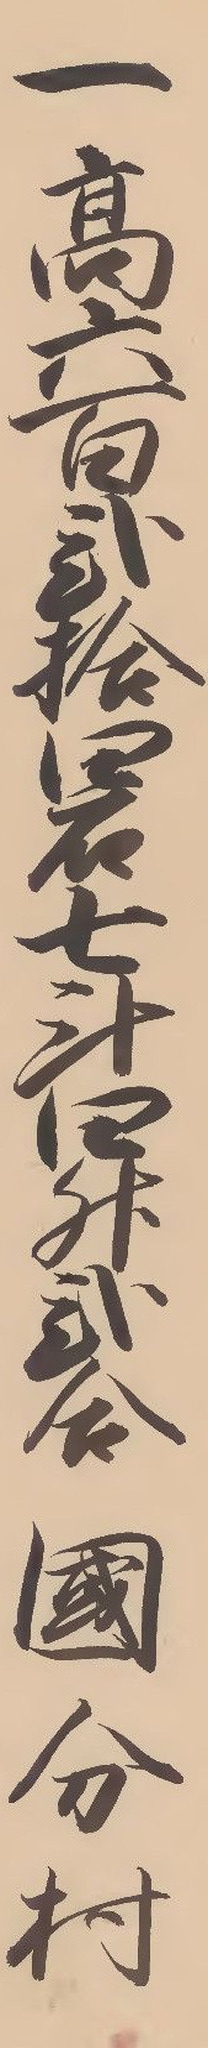一高六百弐拾四石七斗四升弐合国分村
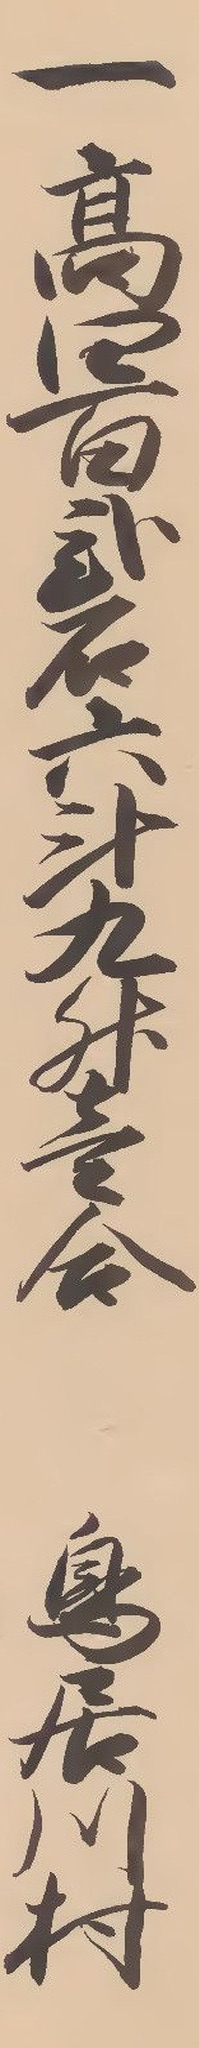一高四百弐石六斗九升壱合鳥居川村
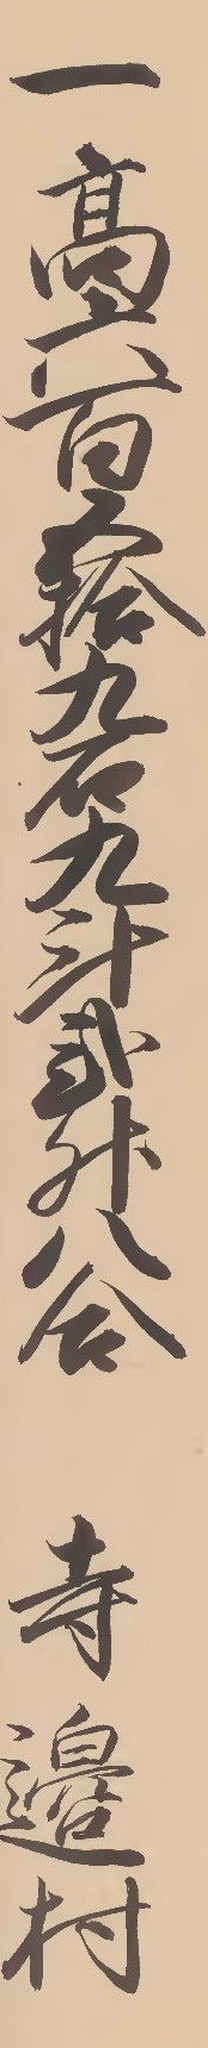一高六百五拾九石九斗弐升八合寺辺村
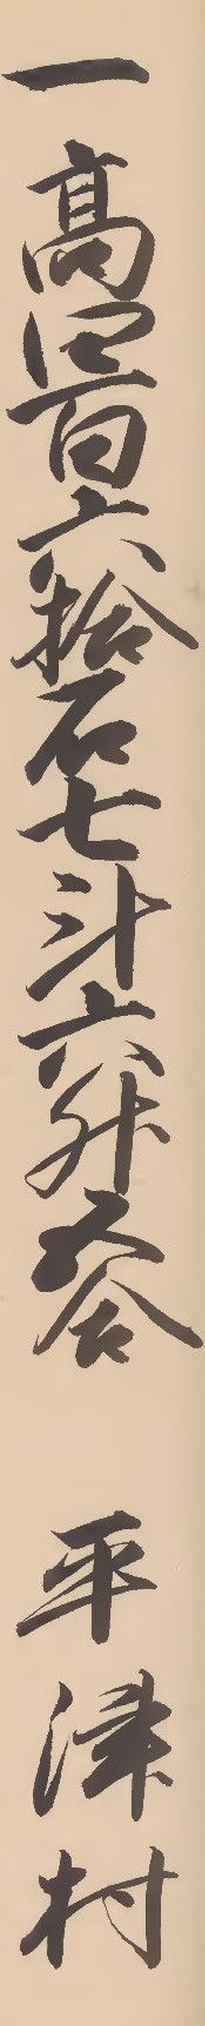一高四百六拾石七斗六升五合平津村
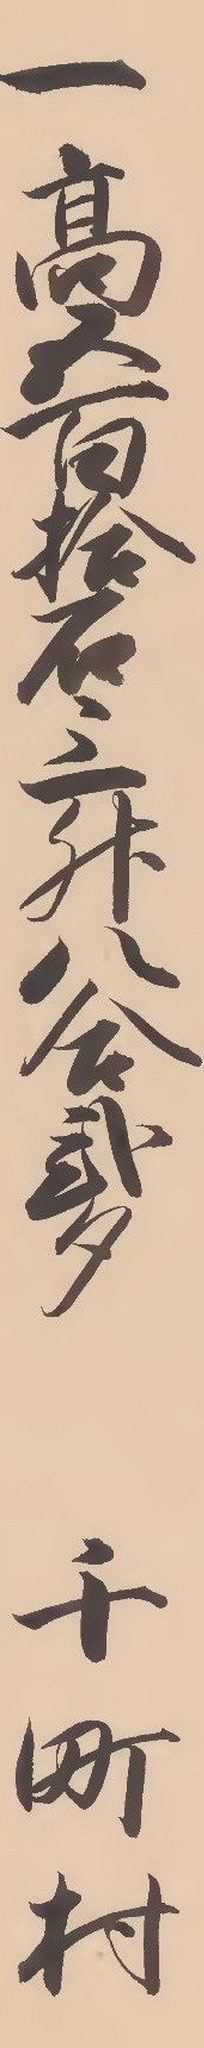一高五百拾石三升八合弐勺千町村
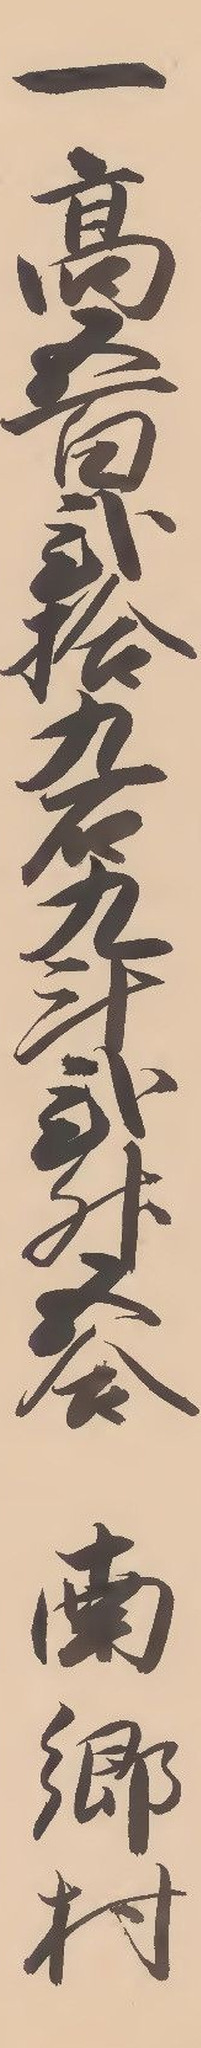一高五百弐拾九石九斗弐升五合南郷村

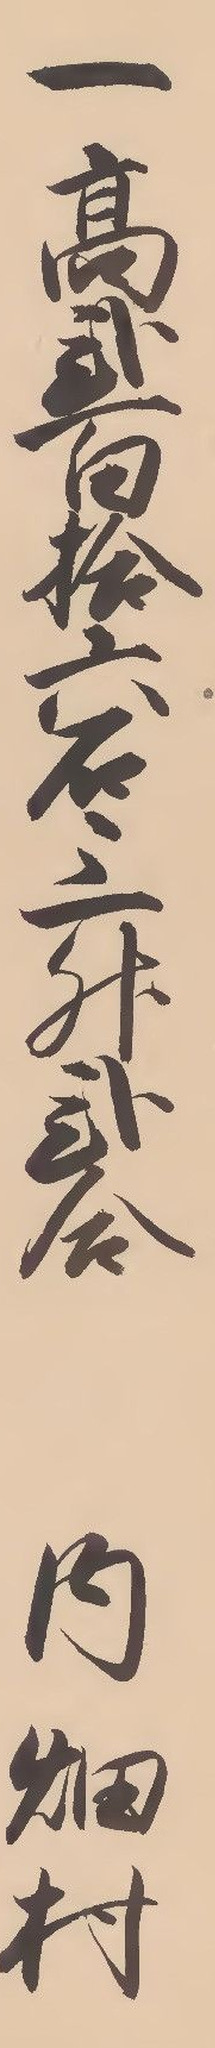一高弐百拾六石三升弐合内畑村
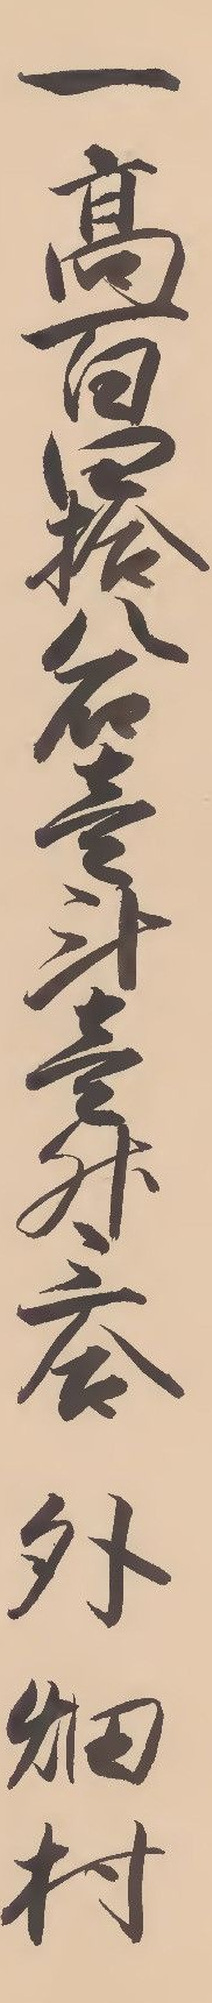一高百四拾八石壱斗壱升三合外畑村
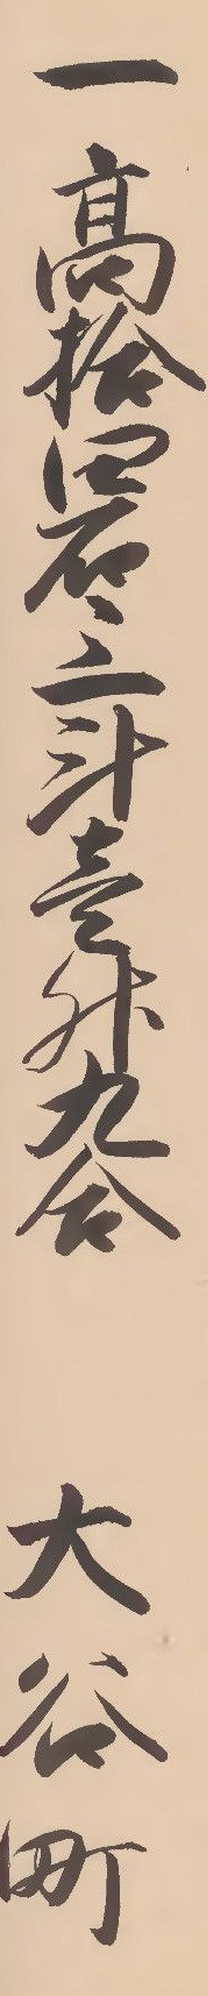一高拾四石三斗壱升九合大谷町
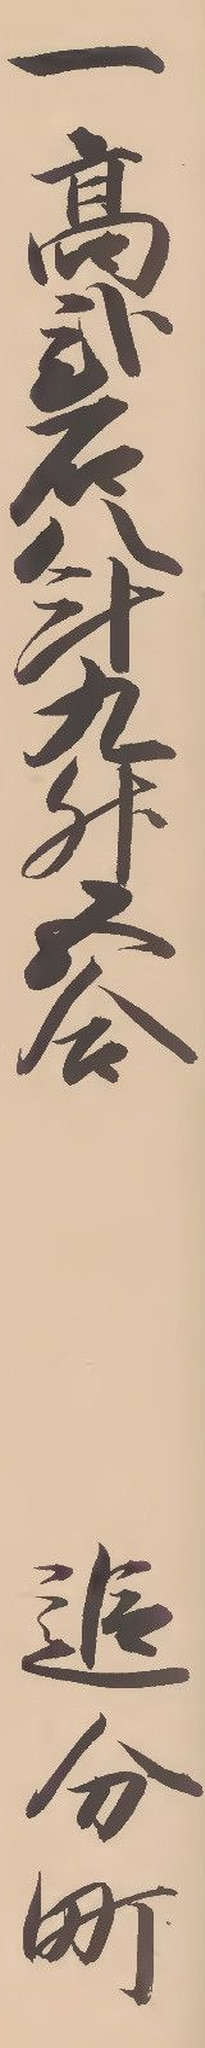一高弐石八斗九升五合追分町
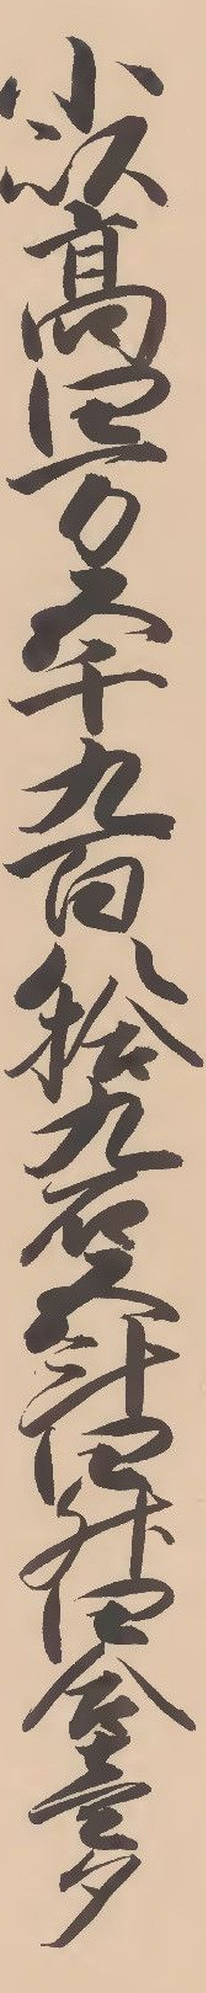小以高四万五千九百八拾九石五斗四升四合壱勺

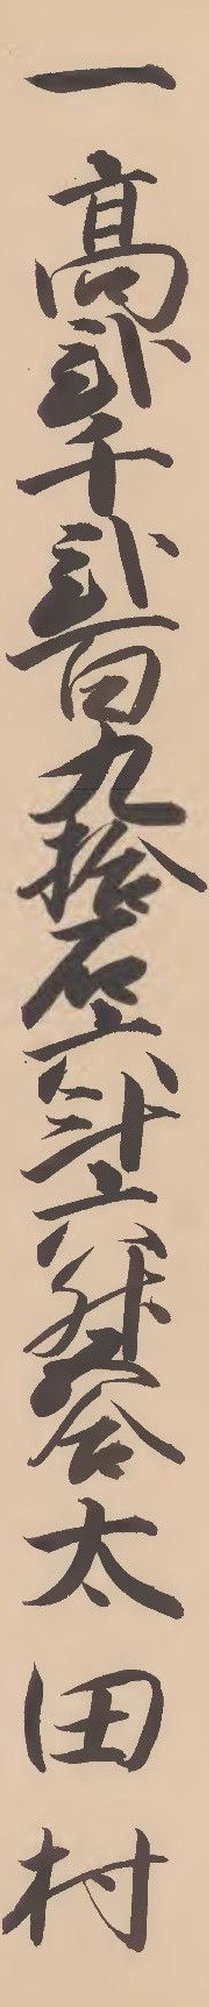一高弐千弐百九拾石六斗六升五合太田村
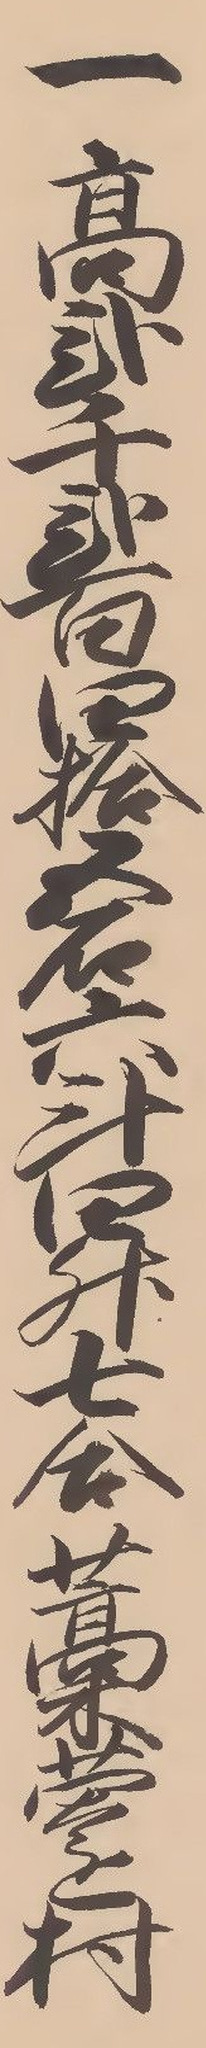一高弐千弐百四拾五石六斗四升七合藁薗村
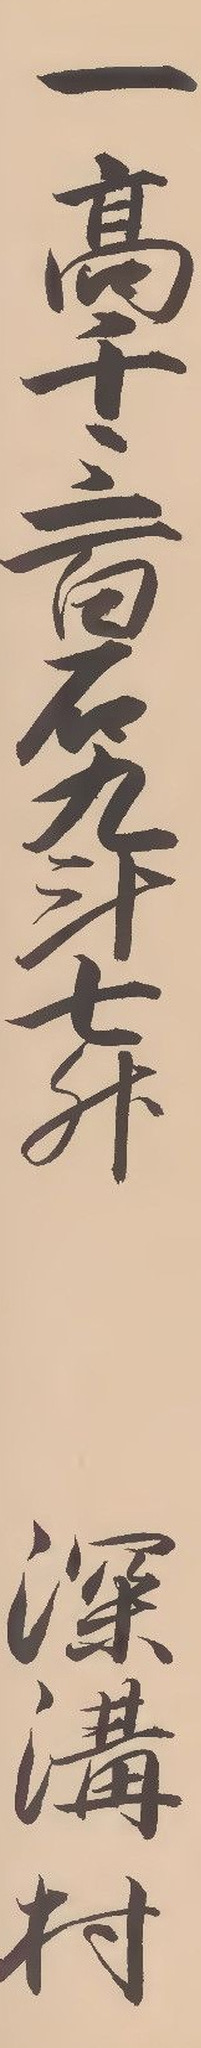一高千三百石九斗七升深溝村
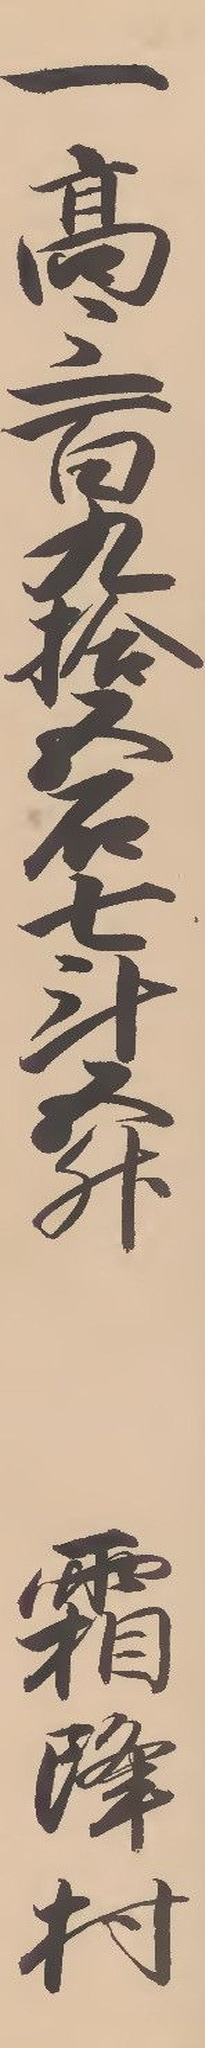一高三百九拾五石七斗五升霜降村
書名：近江国郷帳
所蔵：国立公文書館 National Archives of Japan
